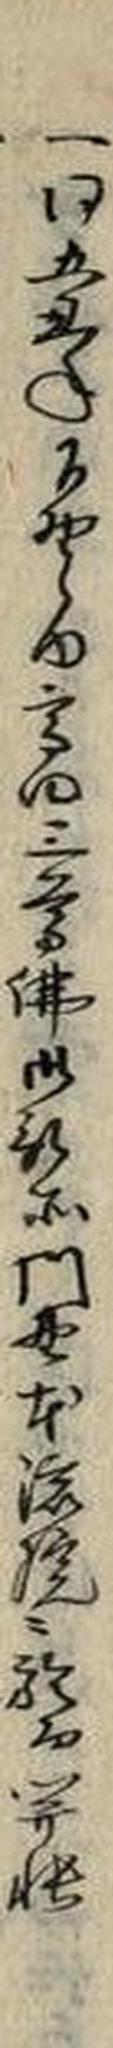一同五丑年下野之内高田三尊仏御預所門野本流院ニ於而開帳
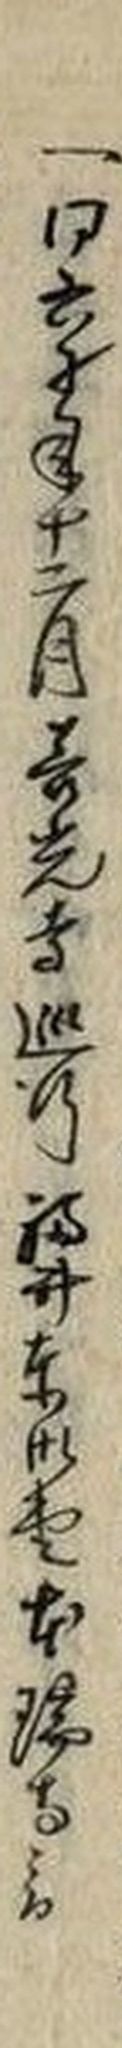一同六寅年十二月善光寺巡行福井東御堂本瑞寺ニ而
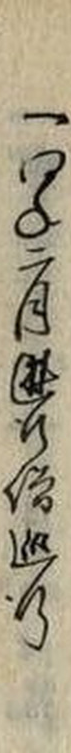一同年二月遊行僧巡行
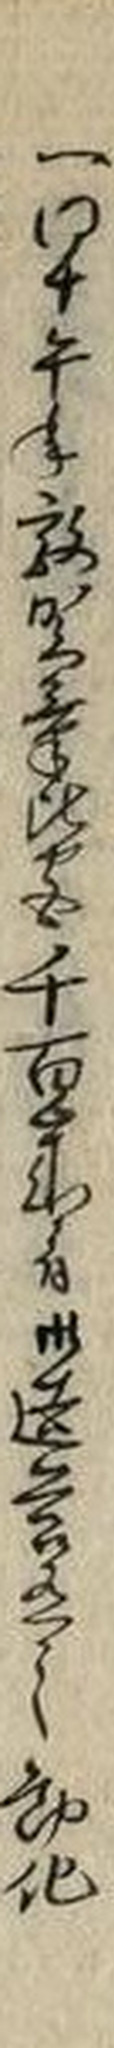一同十午年敦賀気比宮千百歳ニ付御造営有之勧化
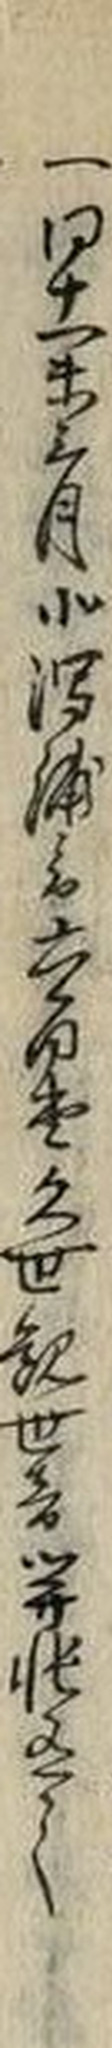一同十一未三月北潟浦ニ而六角堂久世観世音開帳有之
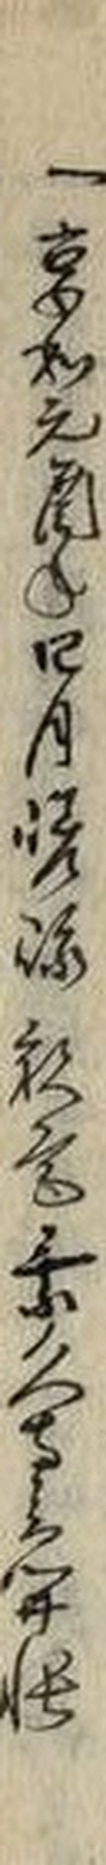一享和元酉年四月嵯峨釈尊乗久寺ニ而開帳
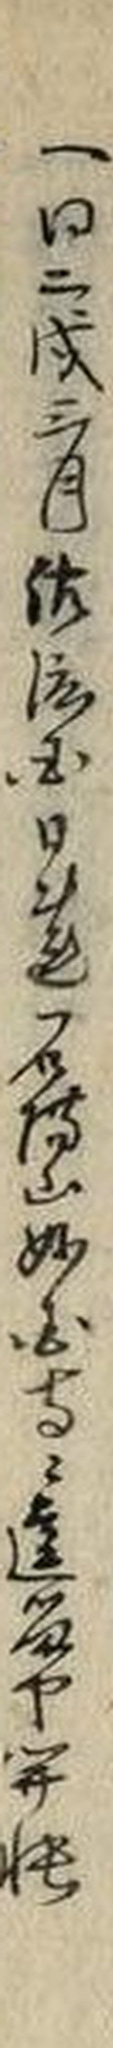一同二戌三月佐渡国日蓮石場山妙国寺ニ還留中開帳
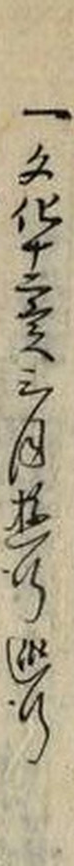一文化十二亥三月遊行巡行
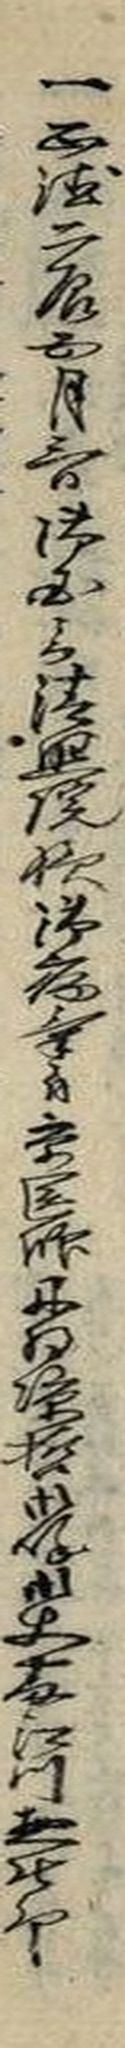一正徳二辰五月三日御国ニ而清照院様御病気ニ付京医師丹羽凉哲御呼御使番江川惣次郎
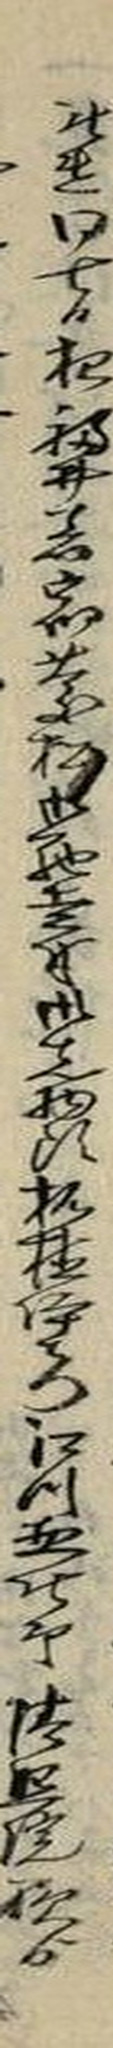被遣同七日夜福井着宿慶松御馳走付御先物頭柘植伊右衛門江川惣次郎清照院様ゟ
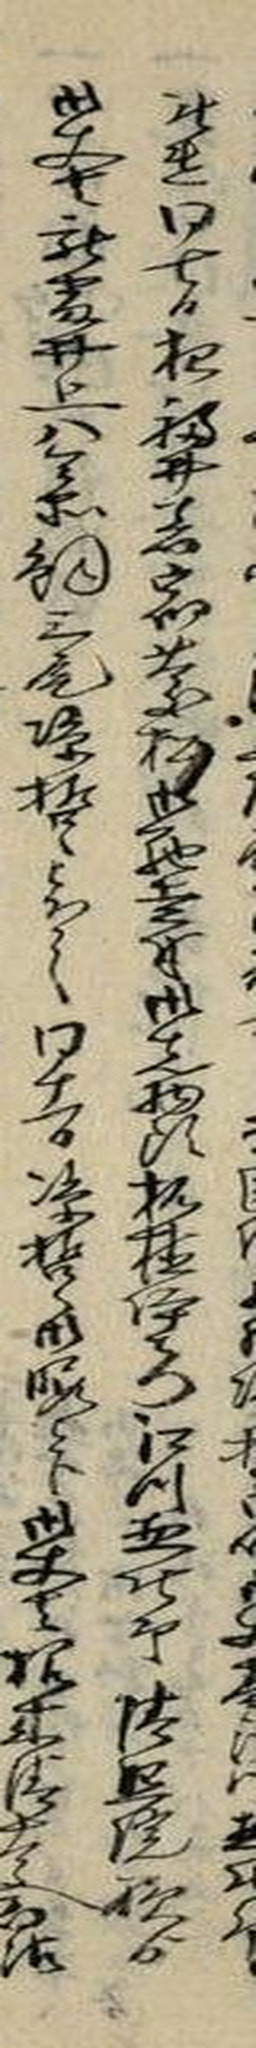御使者新番井上八兵衛鯛三尾凉哲へ被下之同十一日凉哲へ御暇被下御使者根来清太夫」白銀
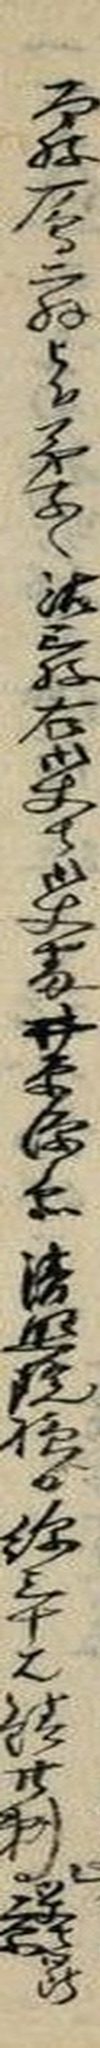百枚鳫二羽被下弟子へ銀三枚右御使者御使番井原源兵衛清照院様ゟ綿三十疋鯖廿刺御使者同断京
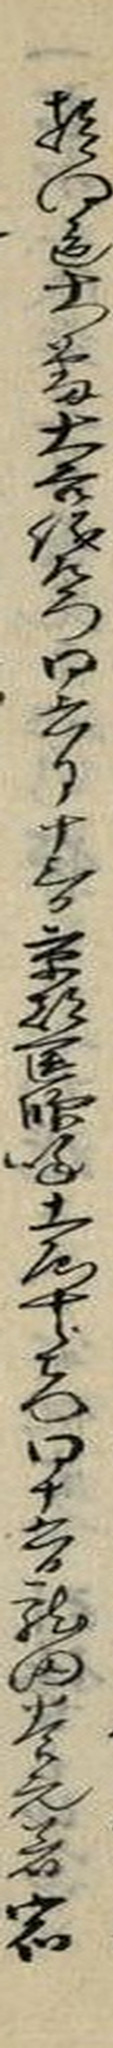都同道大番大谷儀左衛門同六月十三日京都医師呼土屋十郎右衛門同十六日龍田養元着宿
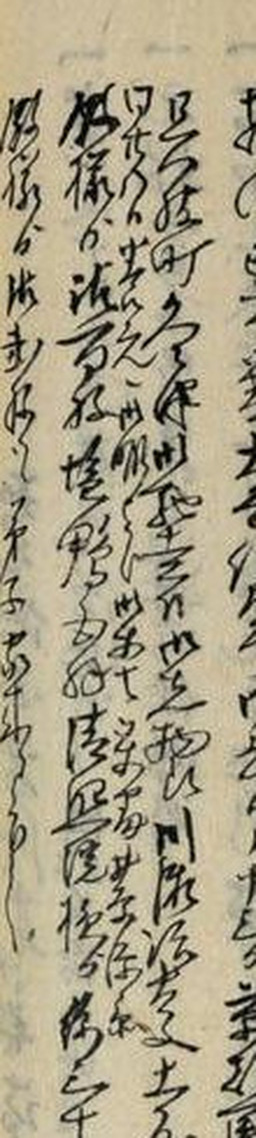同廿八日養元へ御暇被下候御使者御使番井原源兵衛
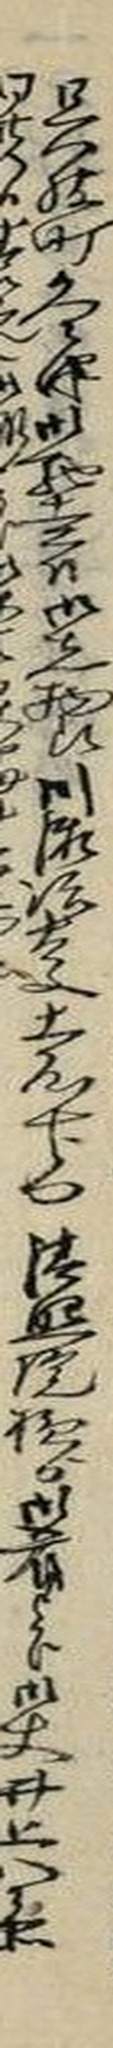呉服町久々津御馳走付御先物頭川瀬治太夫土屋十郎右衛門清照院様ゟ御肴被下御使井上八兵衛
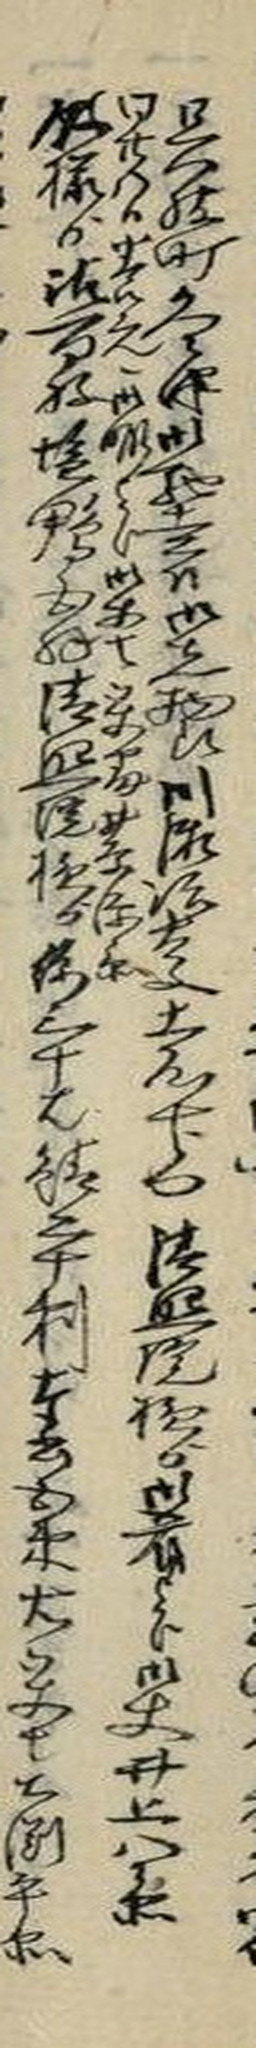殿様ゟ銀百枚塩鴨五羽清照院様ゟ綿三十疋鯖二十刺奉書五束右御使者出淵平兵衛
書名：御国他国諸事之部
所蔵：福井県文書館 Fukui Prefectural Archives
